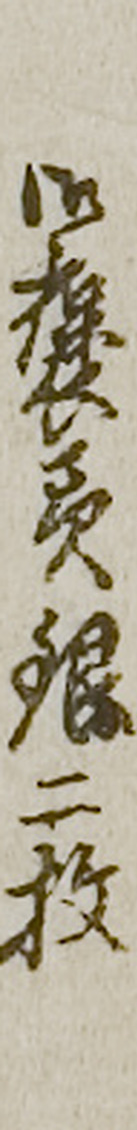御褒美銀二枚
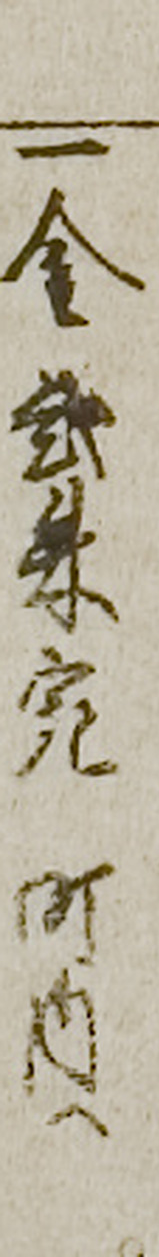一金弐朱宛町内へ
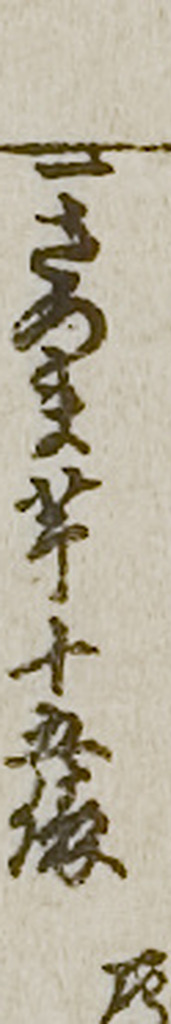一さつま芋十俵
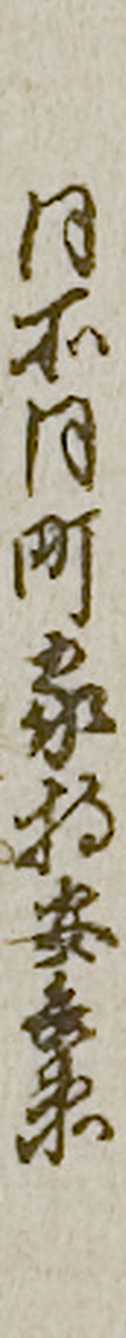同所同町家持安兵衛
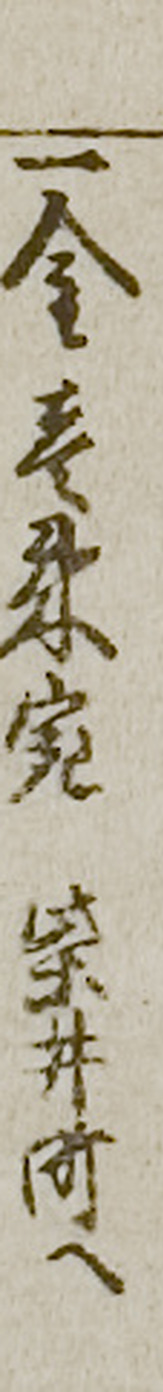一金壱朱宛柴井町へ
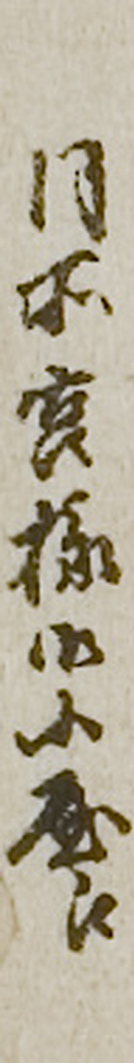同所宮様御小屋江
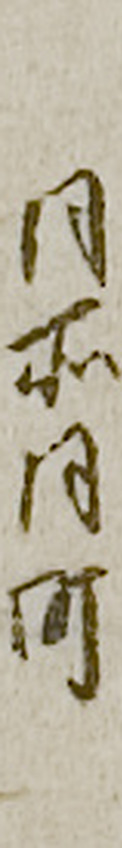同所同町
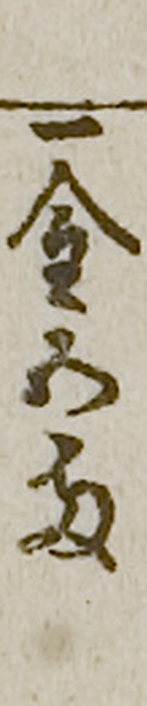一金五両
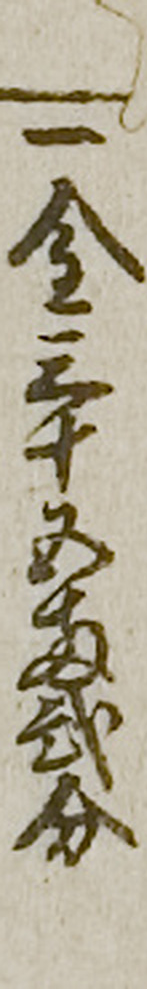一金三十五両弐分
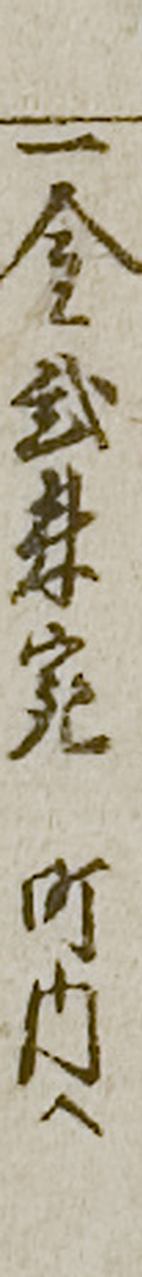一金弐朱宛町内へ
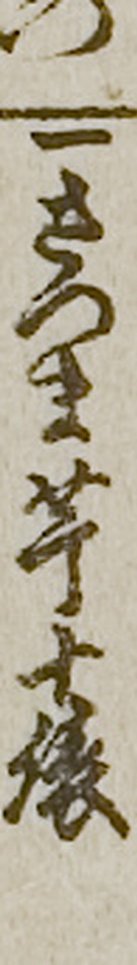一さつま芋十俵
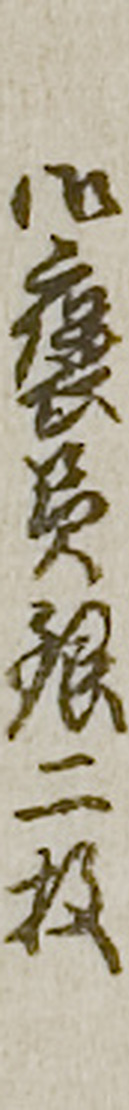御褒美銀二枚
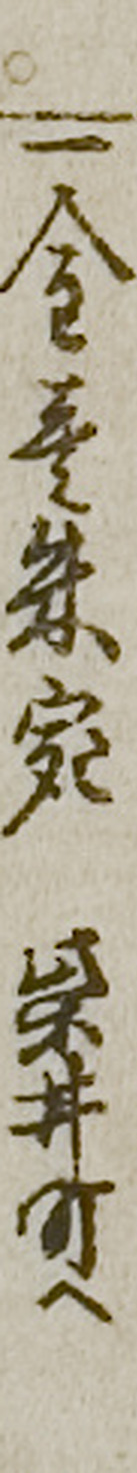一金壱朱宛柴井町へ
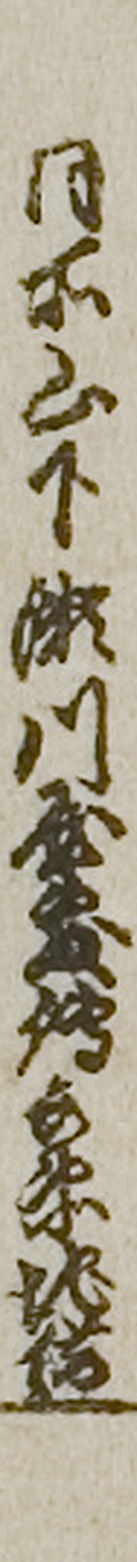同所山下瀬川屋敷伝兵衛地借
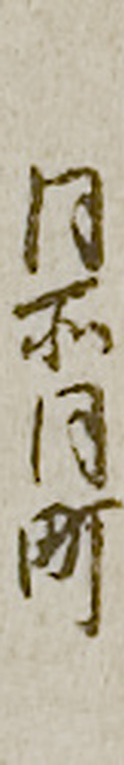同所同町
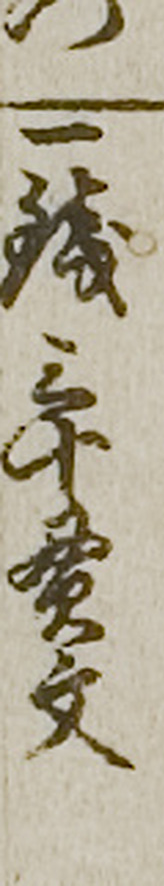一小銭弐十貫文
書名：地震出火御救小屋施行名前附
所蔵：東京大学総合図書館 General Library in the University of Tokyo, JAPAN
